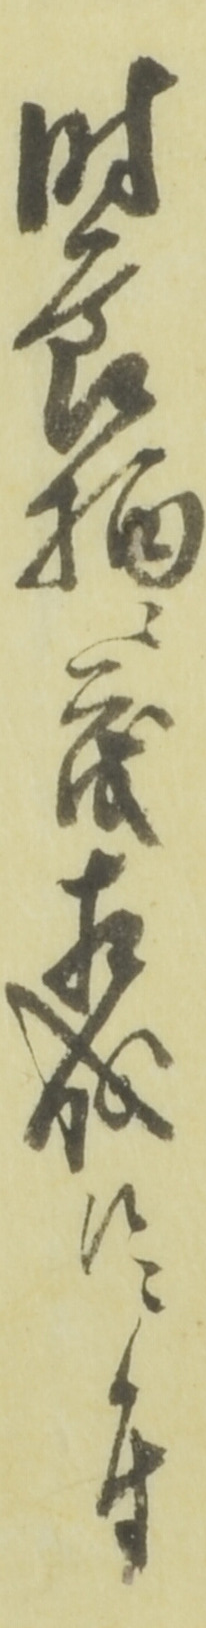時節柄ニも相成候ニ付
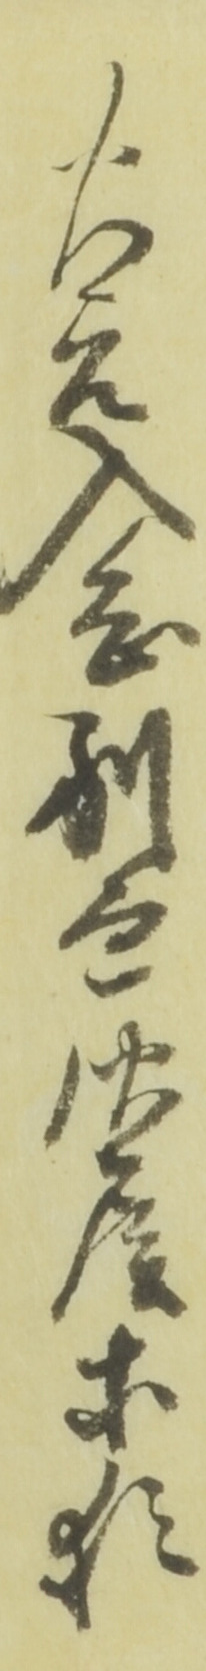火元入念別而灰屋等猶
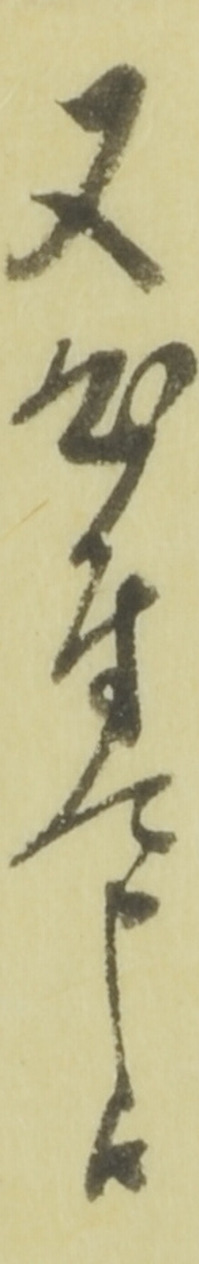又心付可申候
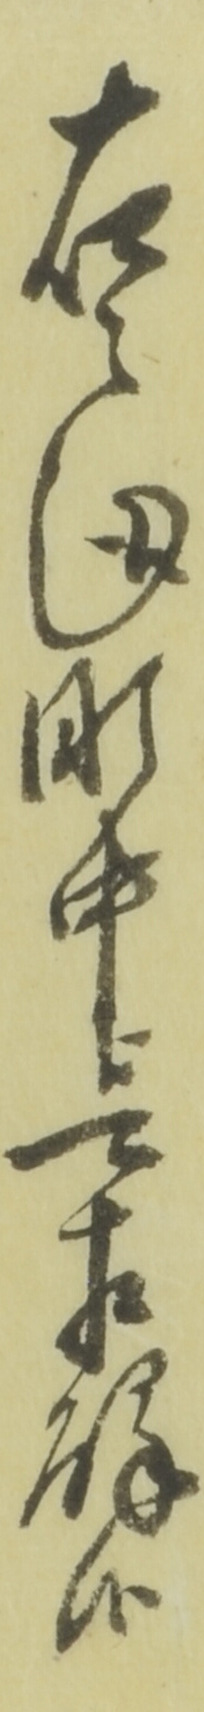右之趣町中江可相触候
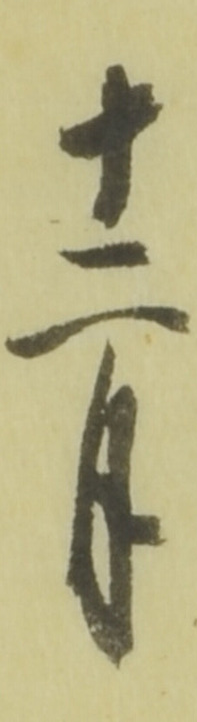十二月
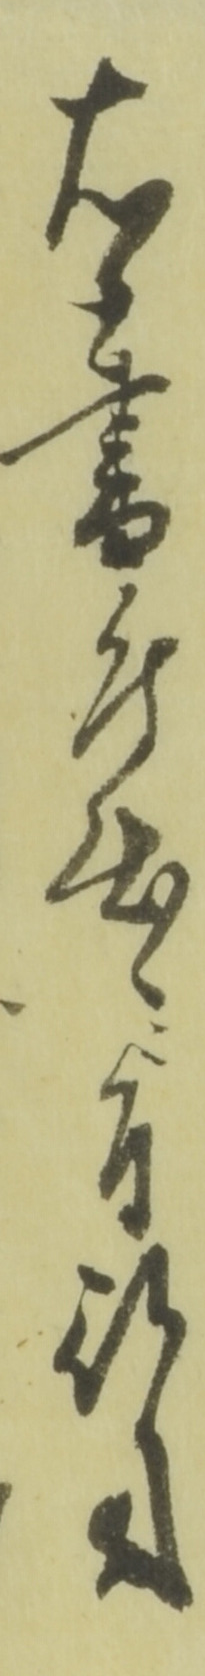右御書付出候ニ付行司
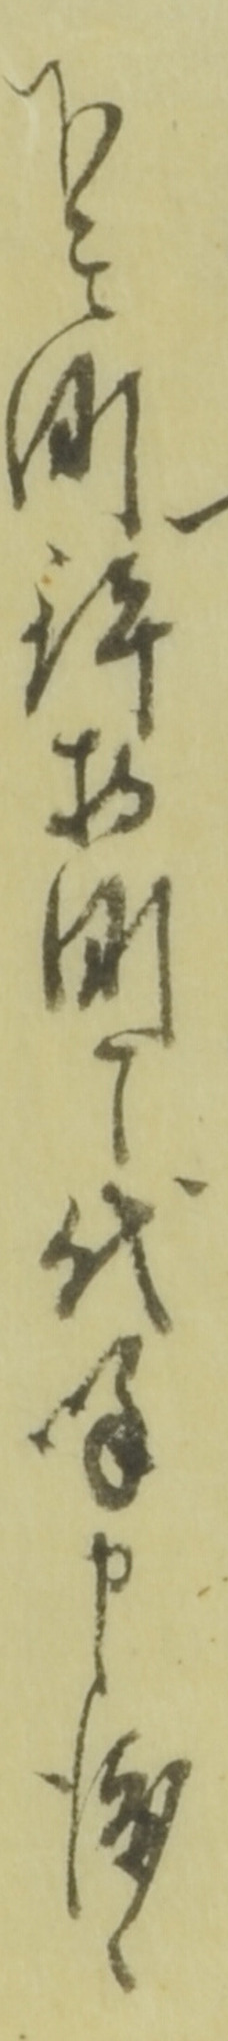下モ町鉾持町丁代呼申渡候

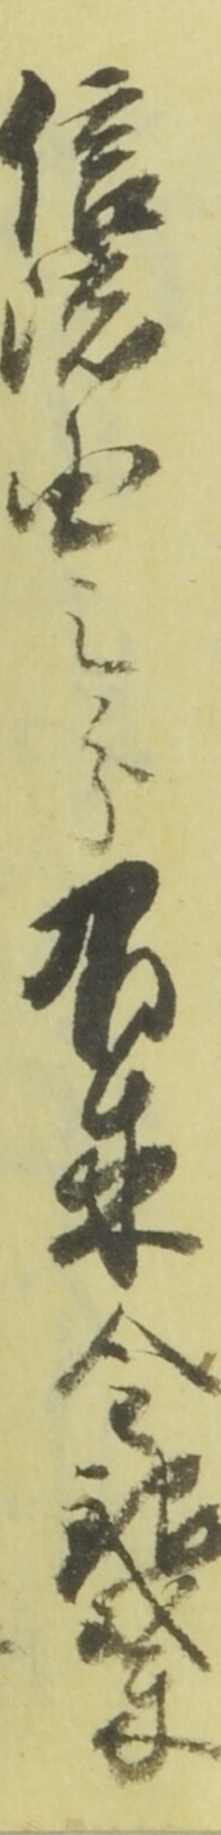信濃国之分有来金銀弐朱
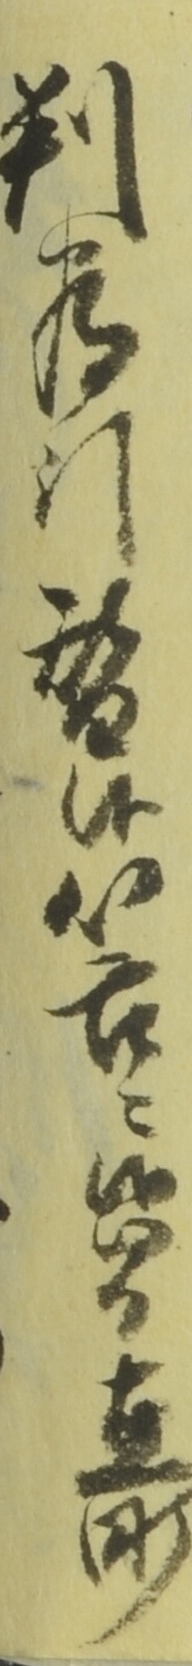判為引替候筈ニ候間在町
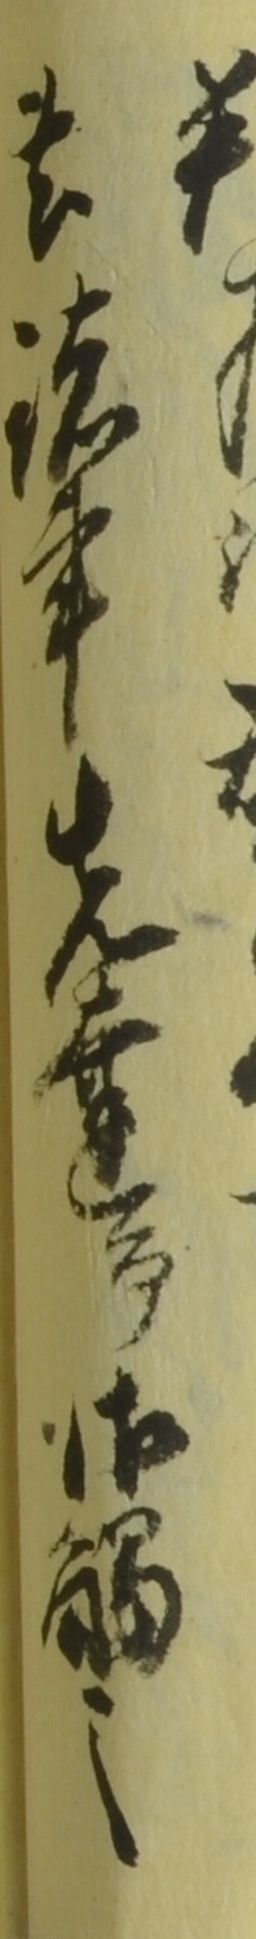共諸事先達而御触之
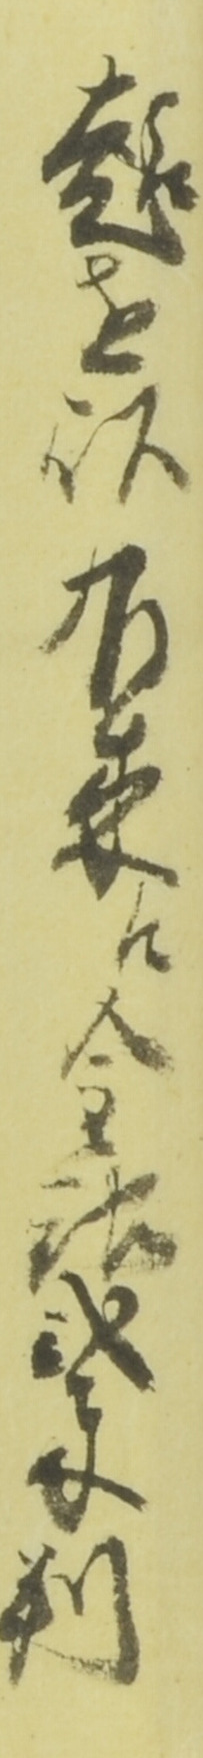趣を以有来ル金銀弐朱判
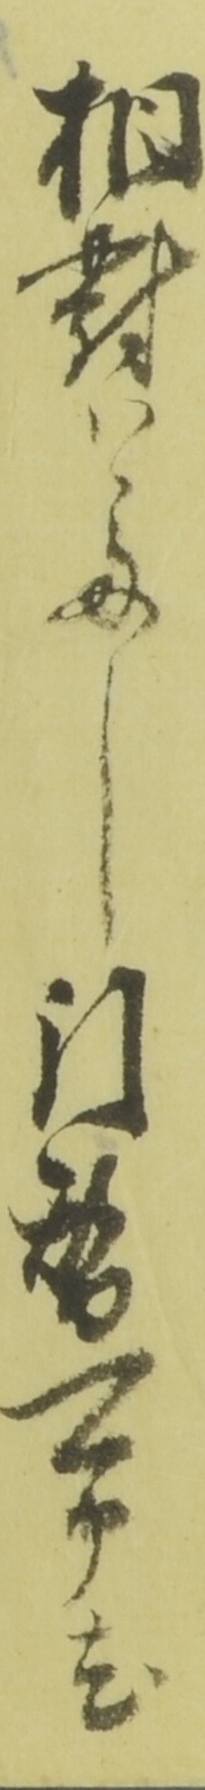相対いたし引替可申尤
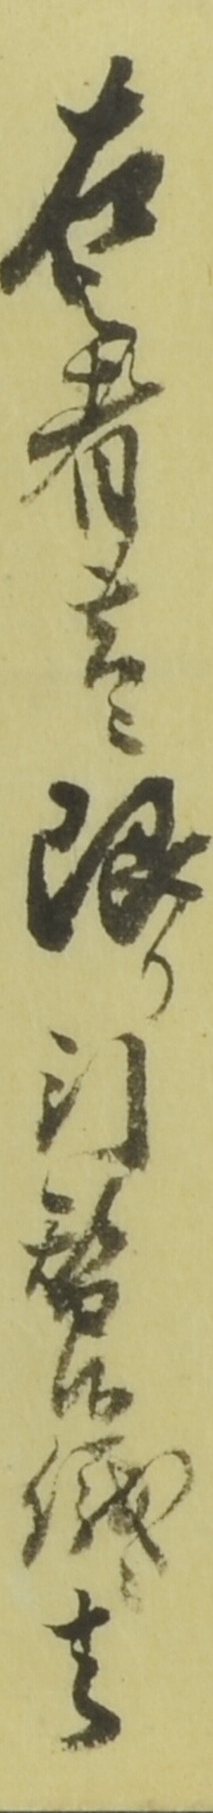右之者共ニ限り引替候儀ニは
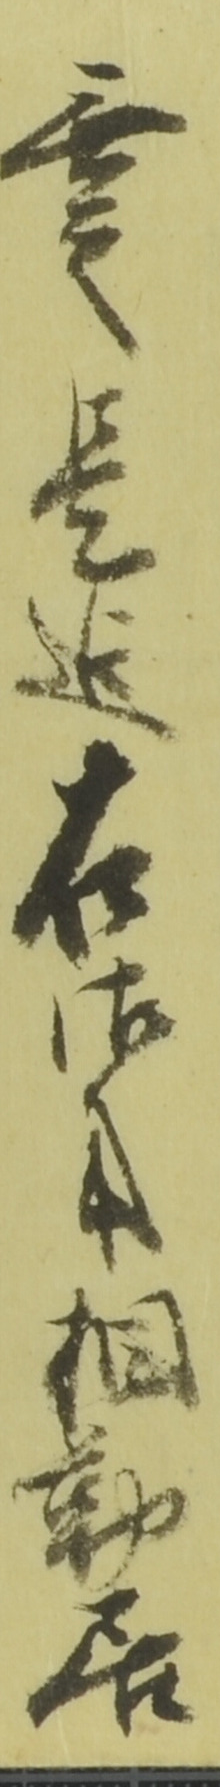無之是迄右御用相勤居
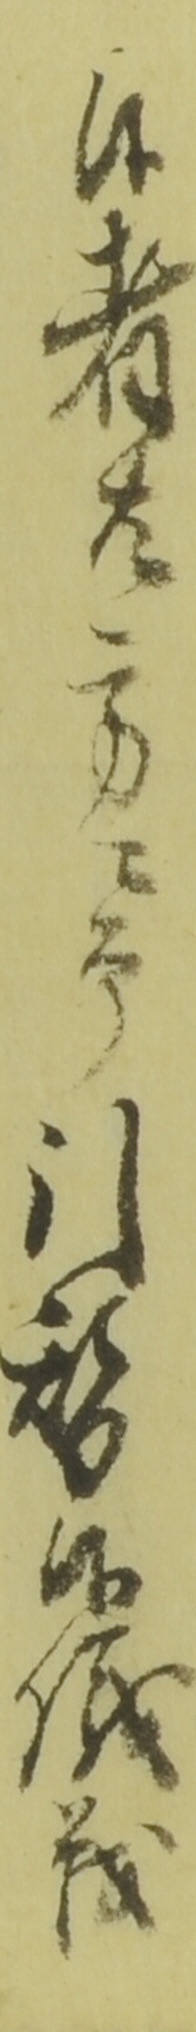候者共方ニ而引替候儀も
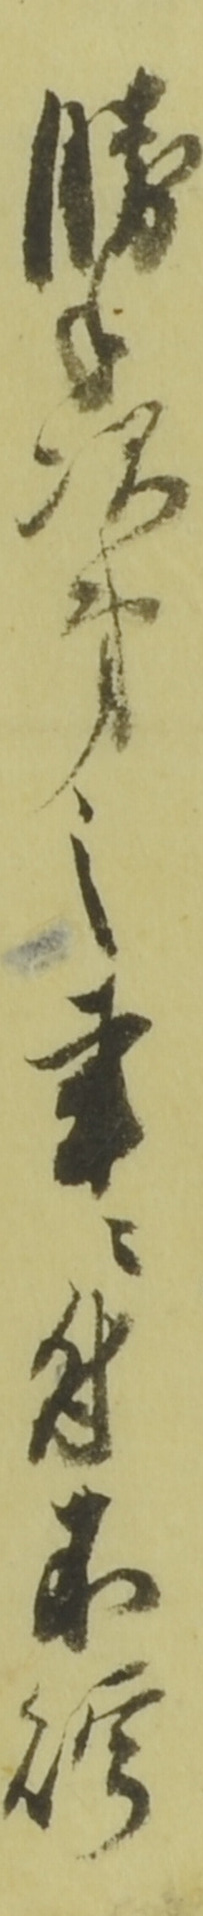勝手次第之事ニ付不貯
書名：御触書御書附控
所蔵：伊那市立高遠町図書館・合同会社AMANE
